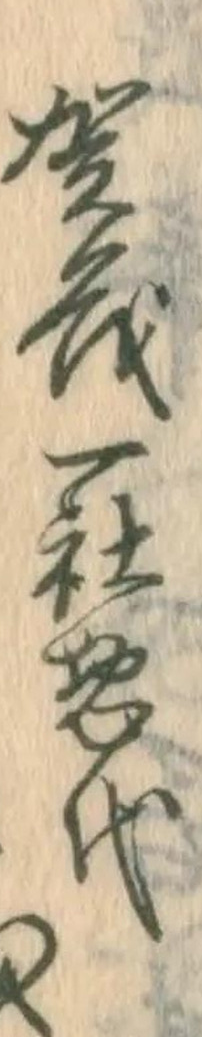賀茂一社惣代
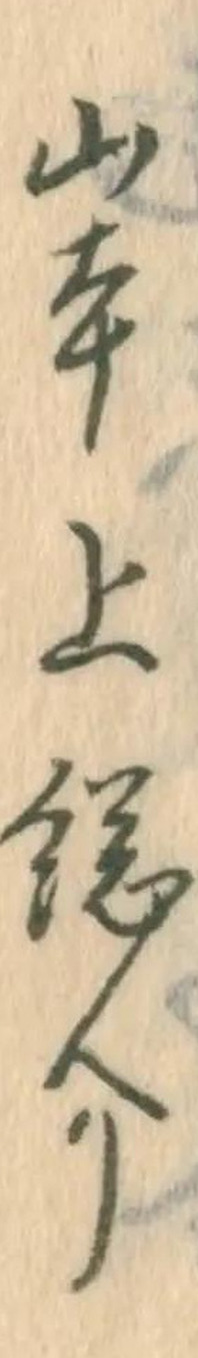山本上総介
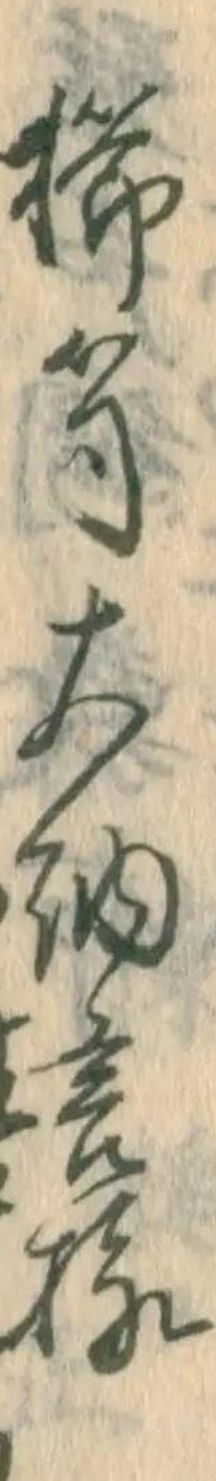櫛笥大納言様
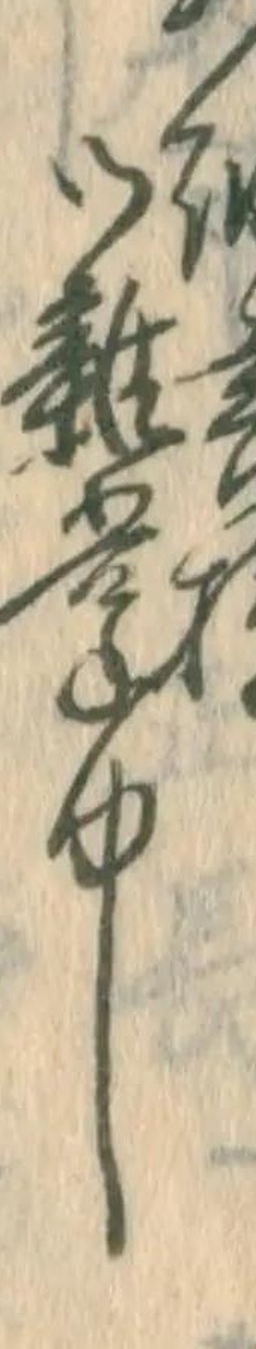御雑掌中
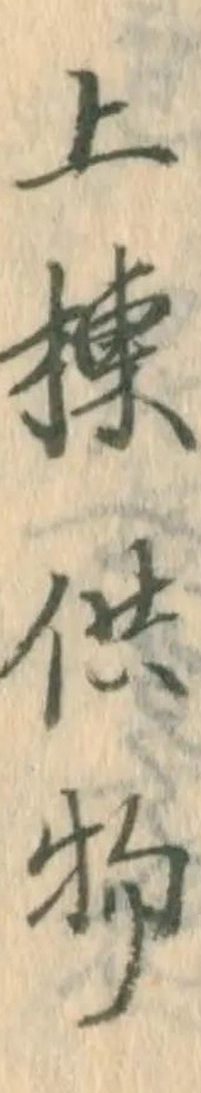上棟供物
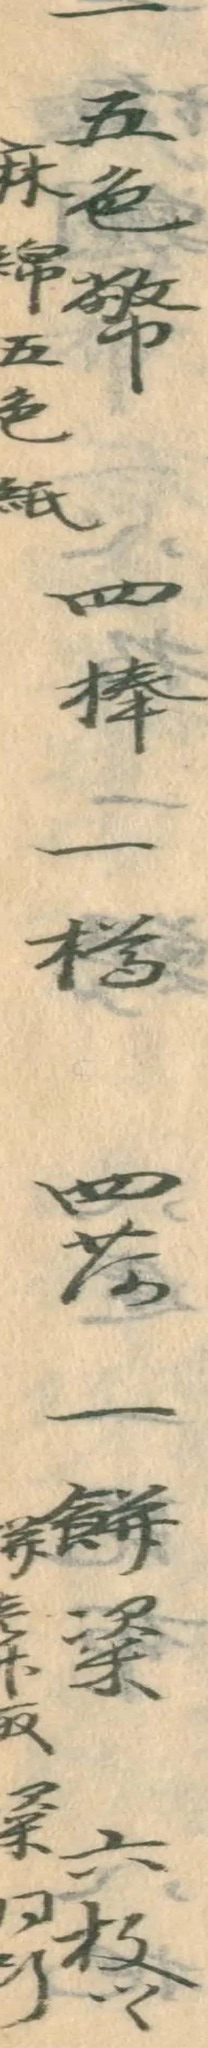一五色幣四捧一樽四荷一餅粢六枚ツヽ

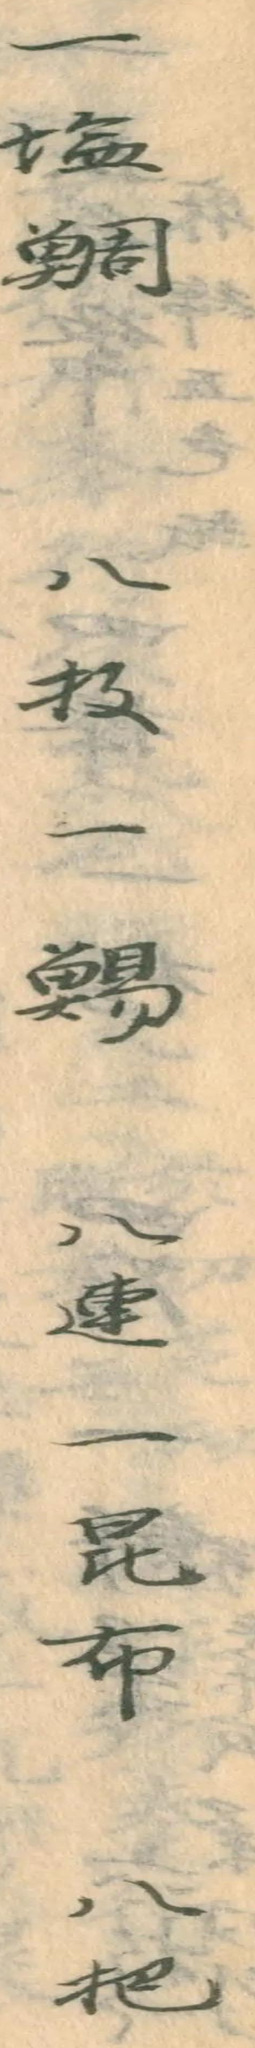一塩鯛八枚一錫八連一昆布八把
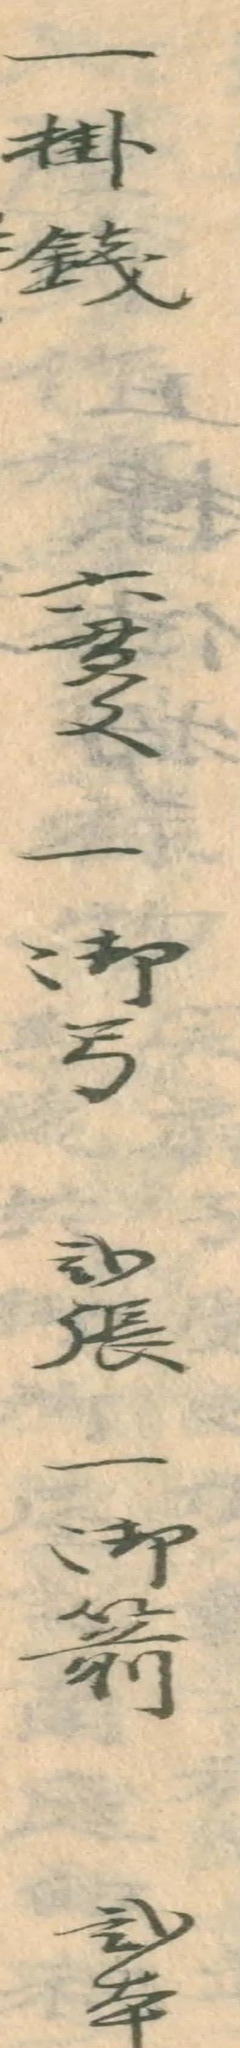一掛銭六貫文一御弓弐張一御箭弐本
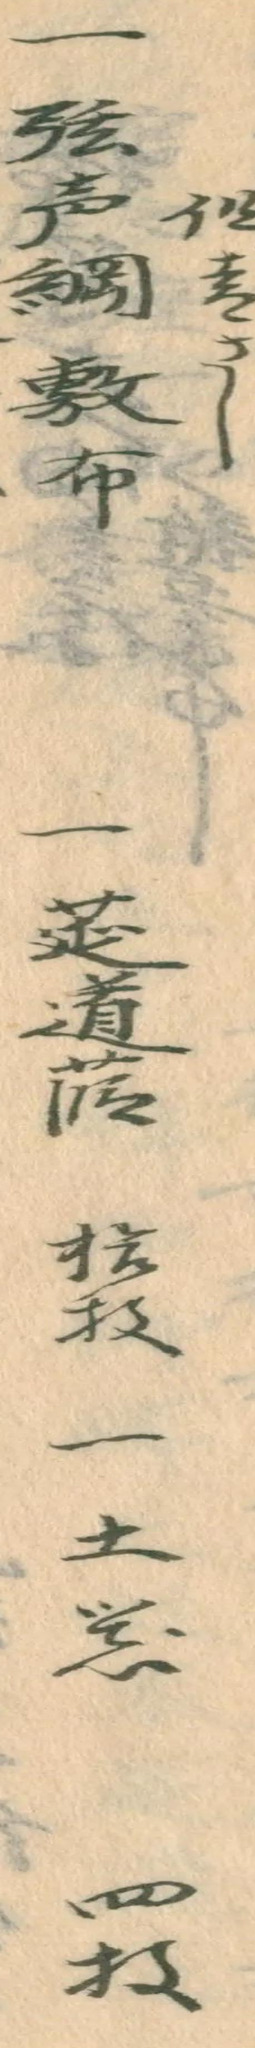一弦声綱敷布一筵道葭拾枚一土器四枚
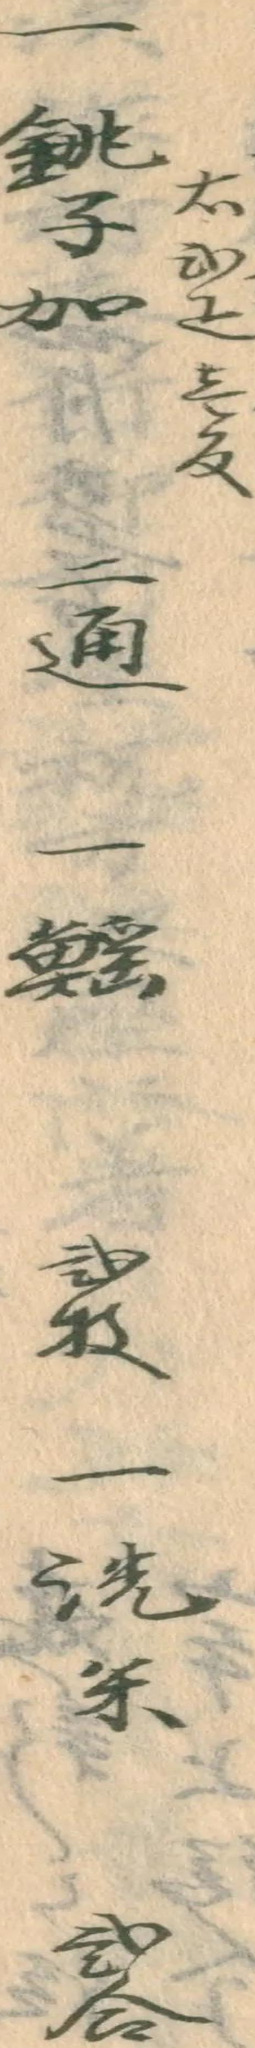一銚子加二通一鰩弐枚一洗米弐合
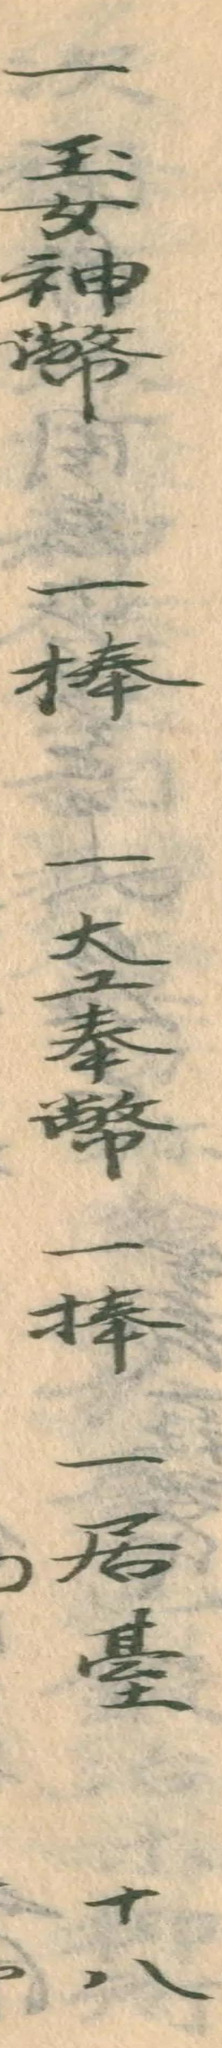一玉女神幣一捧一大工奉幣一捧一居台十八
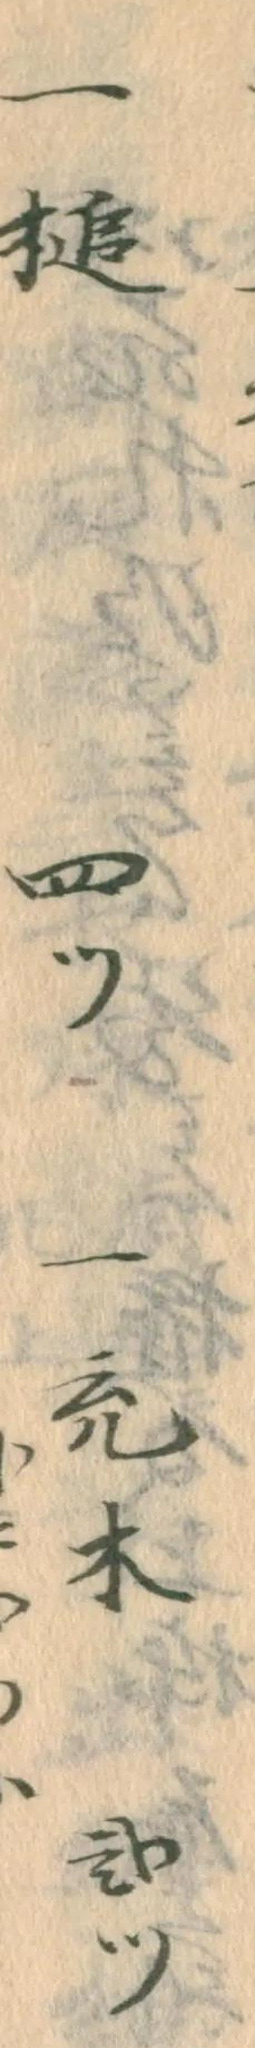一槌四ツ一充木弐ツ
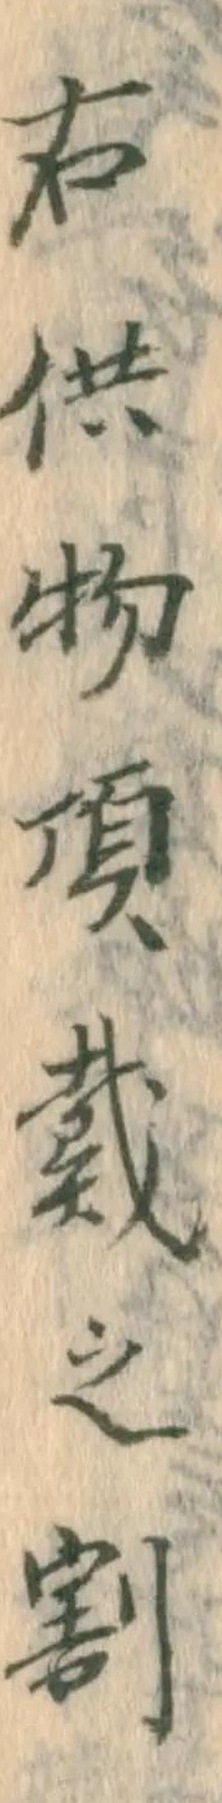右供物頂戴之割
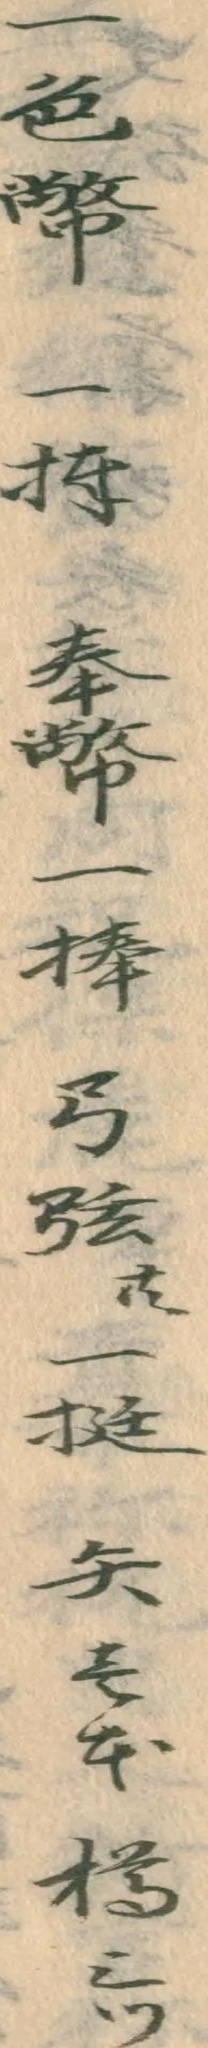一色幣一捧奉幣一捧弓弦共一挺矢壱本樽三ツ
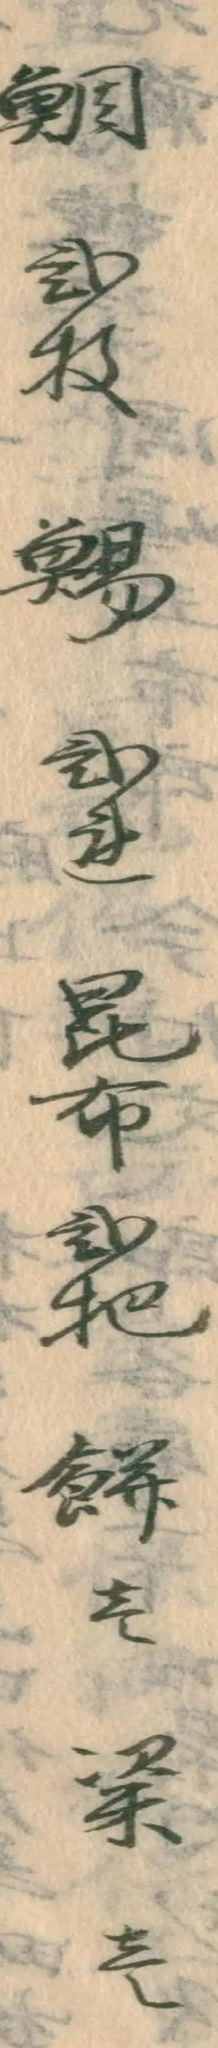鯛弐枚鯣弐連昆布弐把餅壱粢壱
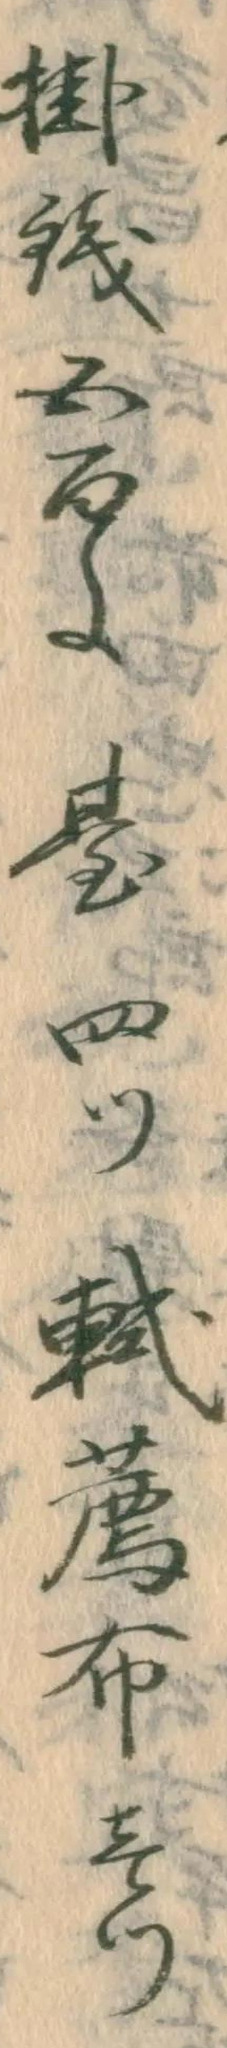掛銭五百文台四ツ軾薦布壱ツ
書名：賀茂社記録. 第17冊
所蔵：国立国会図書館 National Diet Library, JAPAN
